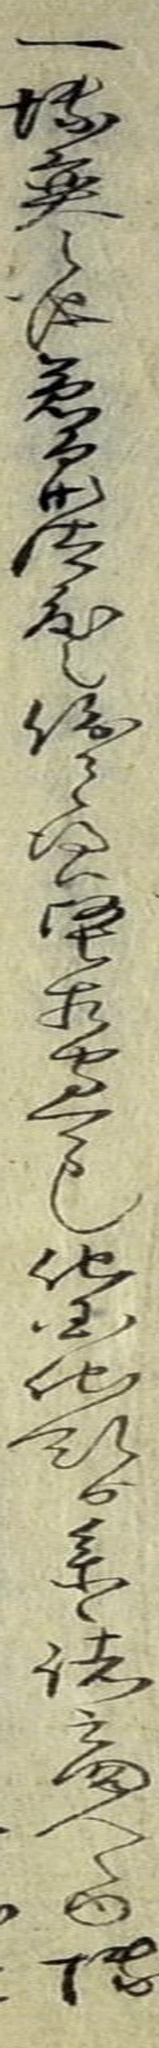一博奕之儀兼而御法度之儀ニ候得ハ堅相守可申候他国他領ゟ参候諸商人之内博
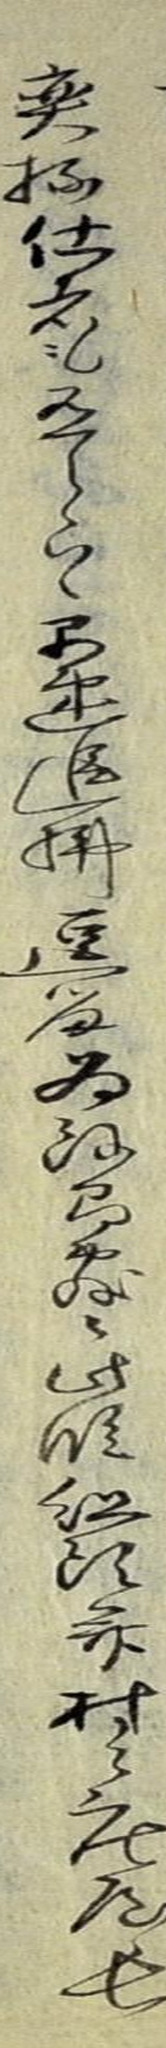奕抔仕者も有之候ハヽ早速追払逗留為致間敷候此段組頭并村々庄屋長
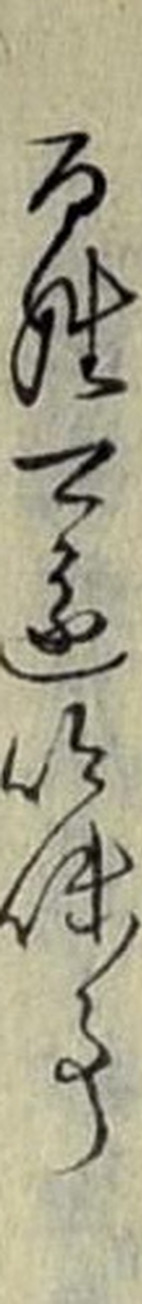百姓可遂吟味事
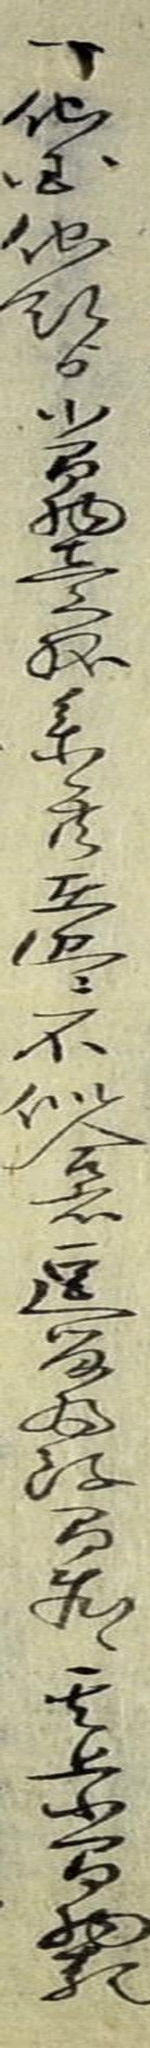一他国他領ゟ小間物売抔参候共在辺ニ不似合者逗留為致間敷候其上小間物類
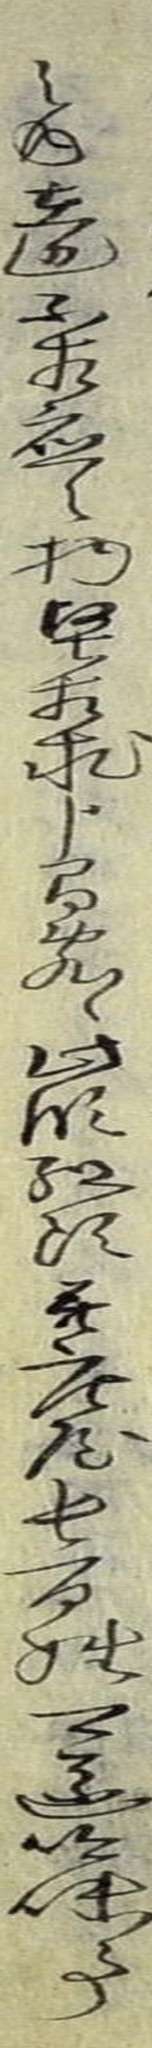之内在辺不相応之物堅相求申間敷候此段組頭并庄屋長百姓可遂吟味事
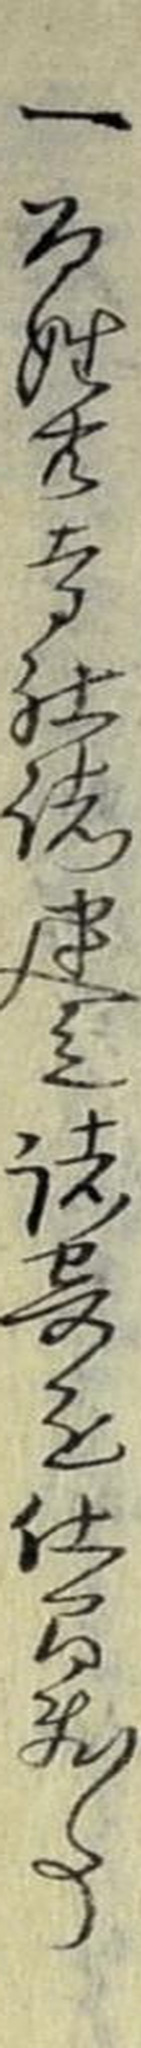一百姓共寺社諸建立諸寄進仕間敷事
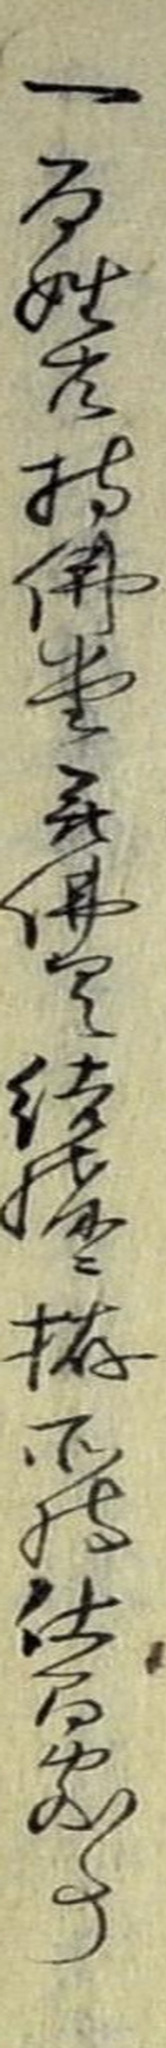一百姓共持仏堂并仏具結構ニ拵所持仕間敷事
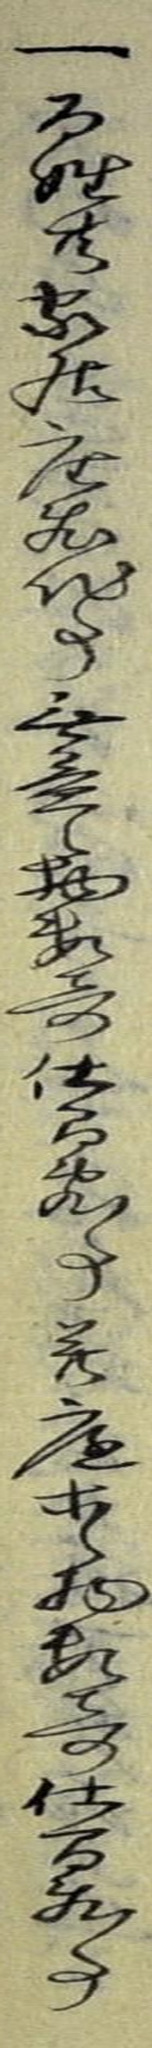一百姓共家居座敷作事無益之物数寄仕間敷事并庭等之物数寄仕間敷事
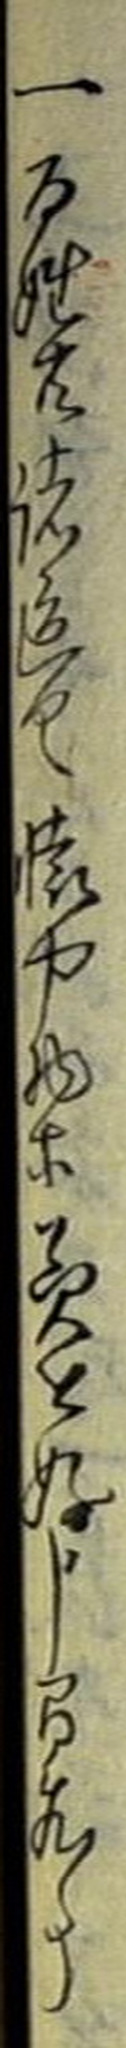一百姓共諸道具懐中物等美を好申間敷事
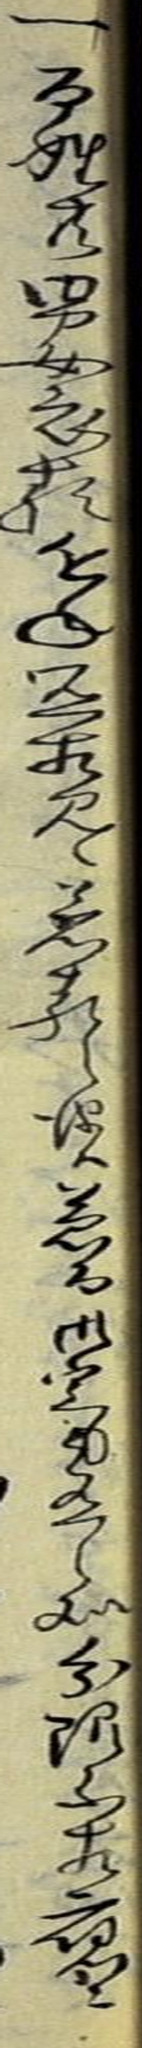一百姓共男女衣類近年宜相見候着類之儀ハ兼而御定も有之処分限不相応ニ
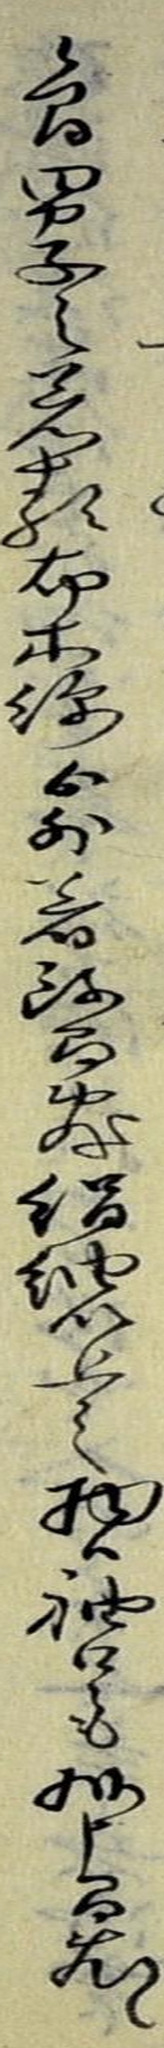候間男子之着類布木綿ゟ外着致間敷絹紬以上之物ハ袖口ニも掛申間敷候
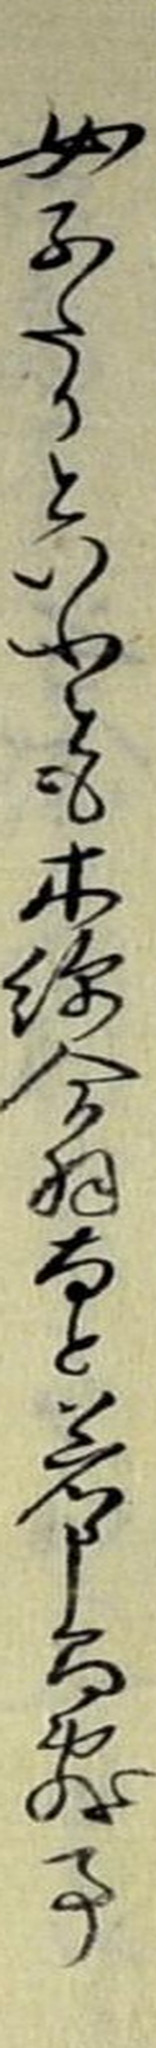女子たりといふとも木綿合羽なと着申間敷事
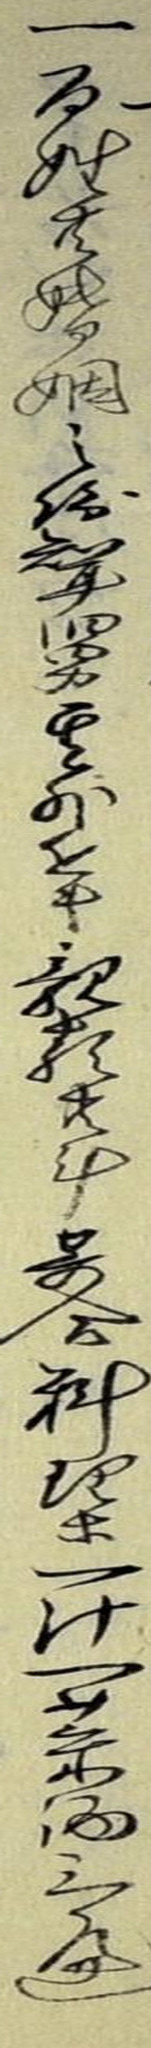一百姓共婚姻之儀聟舅其外近キ親類共斗寄合料理等一汁一菜酒三遍
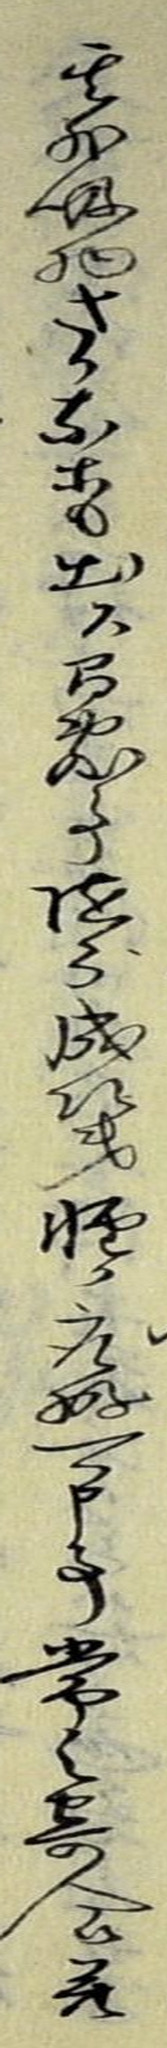其外吸物さかな等も出ス間敷事随分成次第軽ク取扱可申事常之寄合并
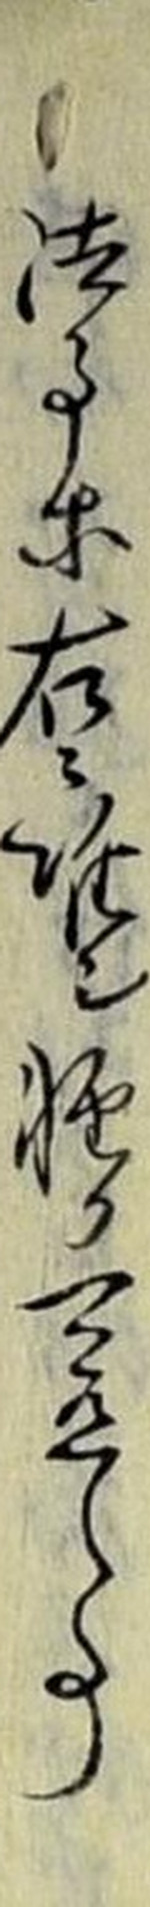法事等右ニ准シ軽ク可有之事
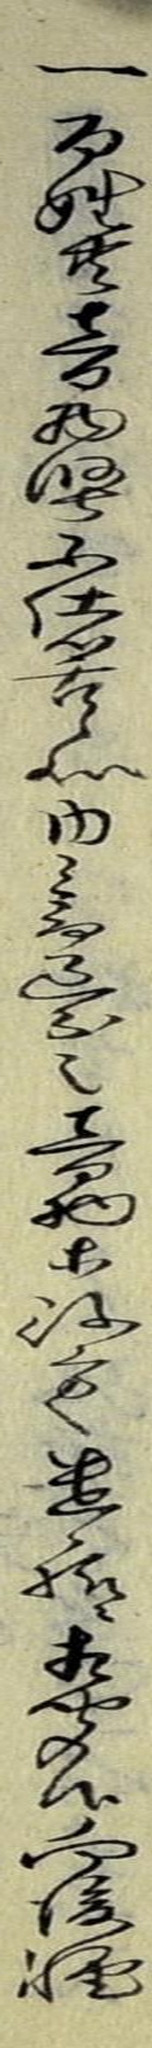一百姓共音物堅不仕筈候処内々ニ而過分之音物等役方へ遣候様ニ相聞候向後軽
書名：命令之部 一
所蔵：福井県文書館 Fukui Prefectural Archives
